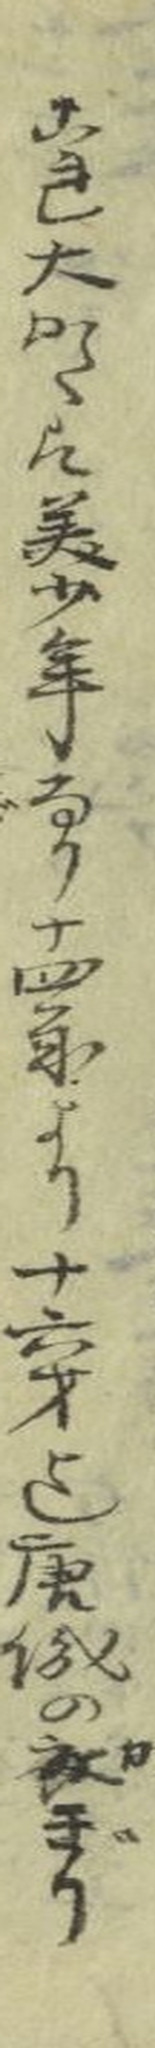これ大かたは美少年なり十四歳より十六才迠唐織のかぎり
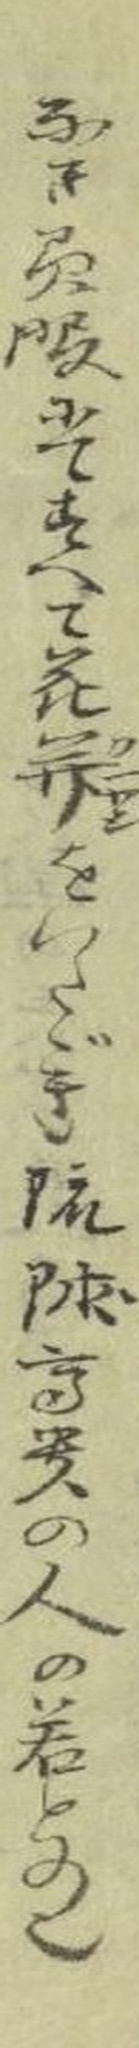なき美服にてすへて花笄をいたゞき琉球高貴の人の若との也
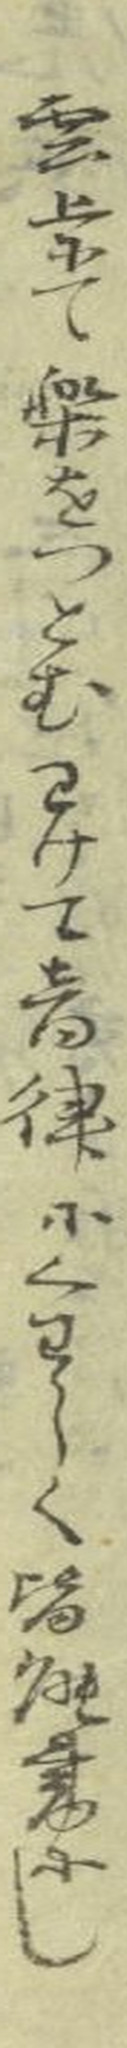雲上にて楽をつとむわけて音律にくわしく皆能書にし
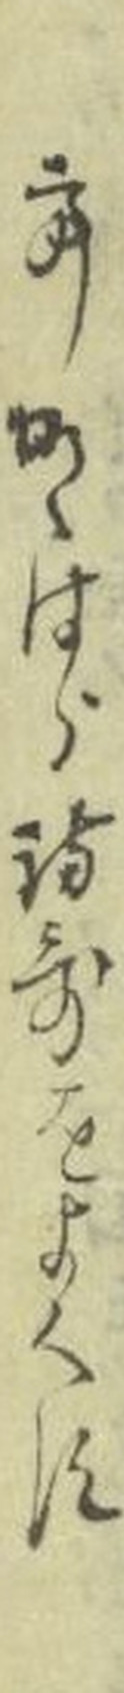舞かたはら詩哥をよくす
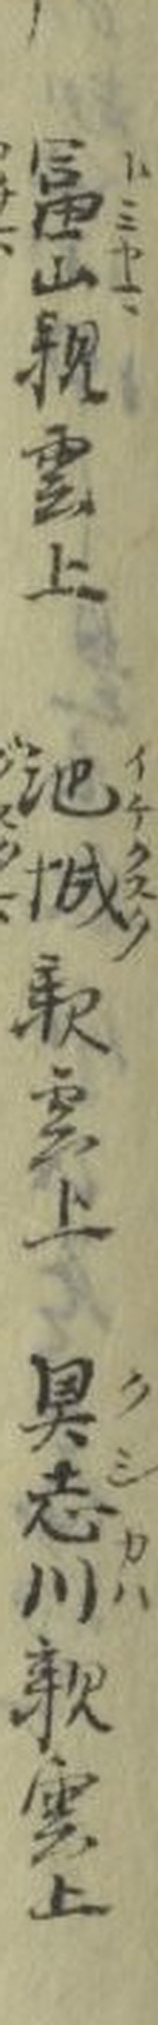楽師冨山親雲上池城親雲上具志川親雲上
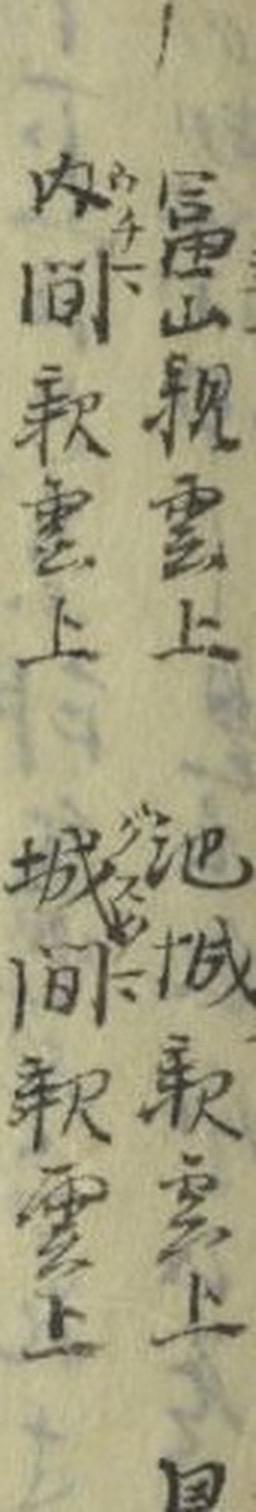内間親雲上城間親雲上
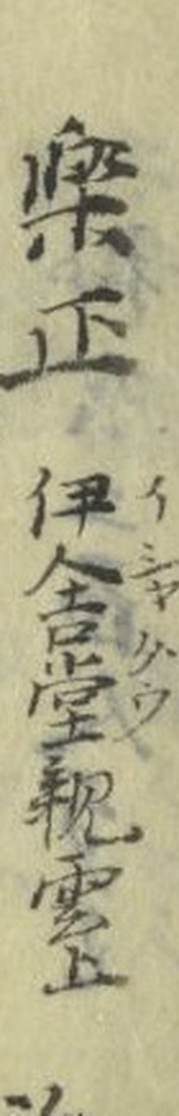楽正伊舎堂親雲上
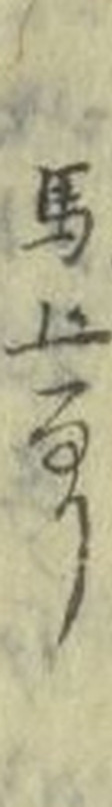馬上なり
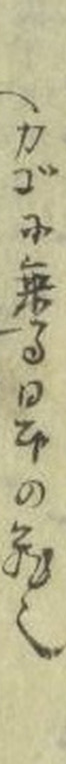カゴに乗る日本の籠也
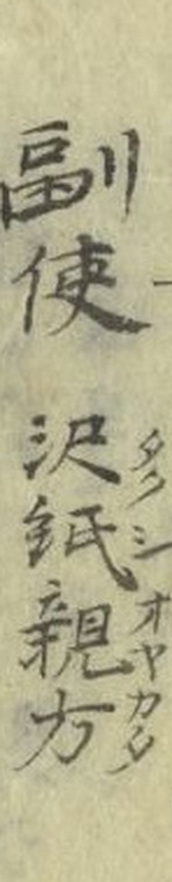副使沢紙親方
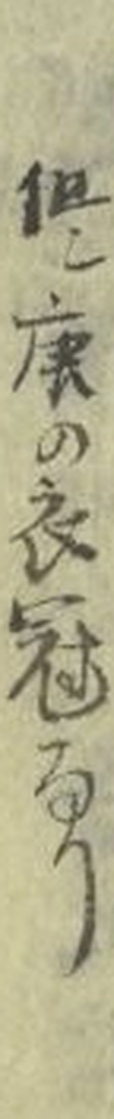但し唐の衣冠なり
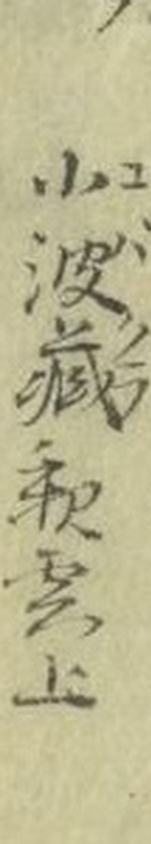小波蔵親雲上
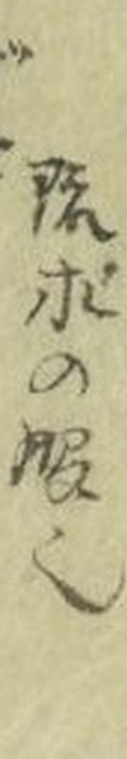琉求の服也
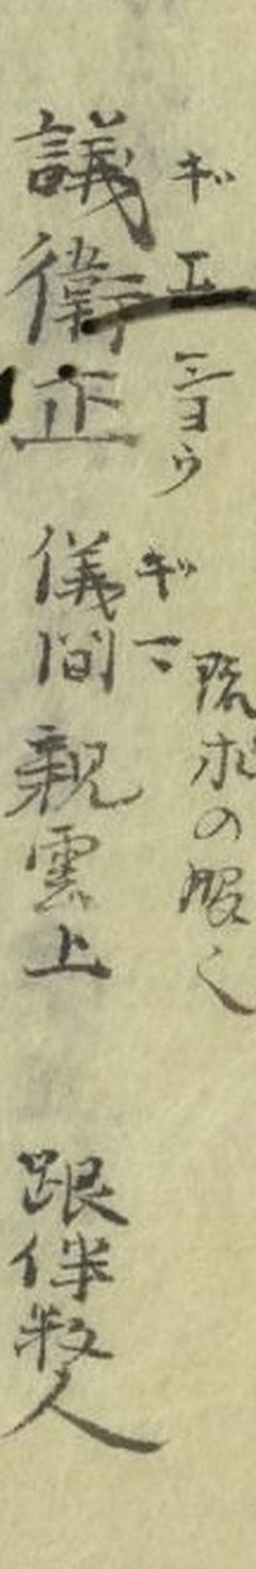議衛正儀間親雲上跟伴数人
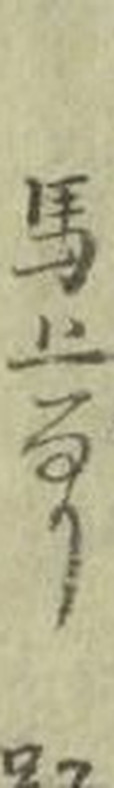馬上なり
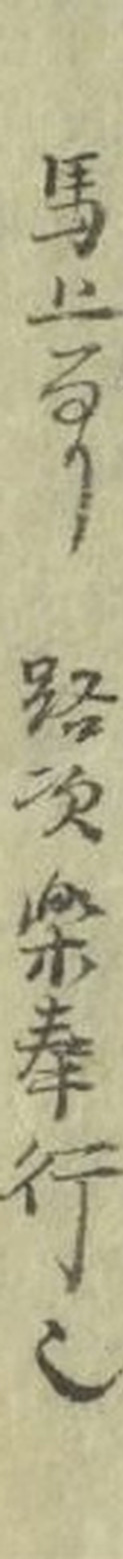馬上なり路次楽奉行也
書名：天保三年来朝 琉球人行列記
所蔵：University of the Ryukyus Library
